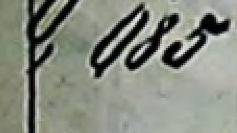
0,085
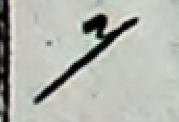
7
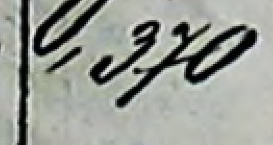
0,370
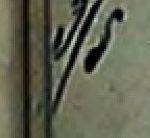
3/5
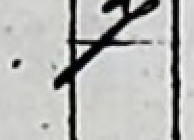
7
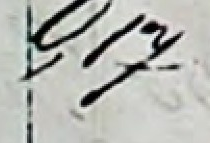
0,17
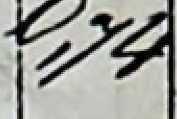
0,74
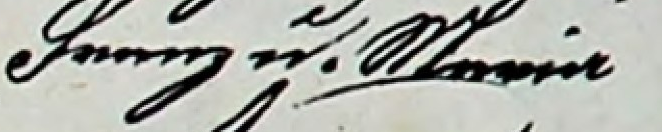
Franz u. Maria
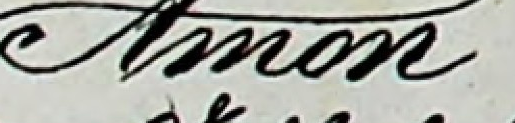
Amon
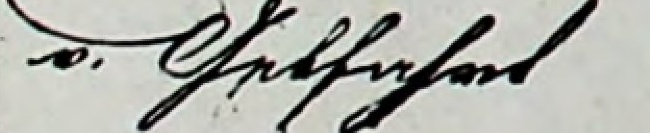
v. Gebfahort
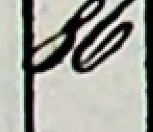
86
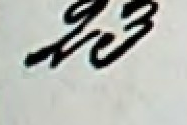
23
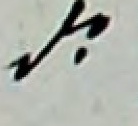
do
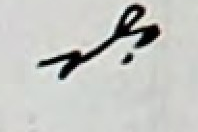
do
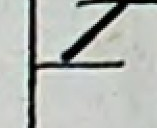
I
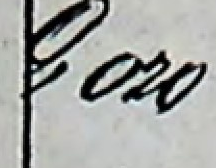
0,020
